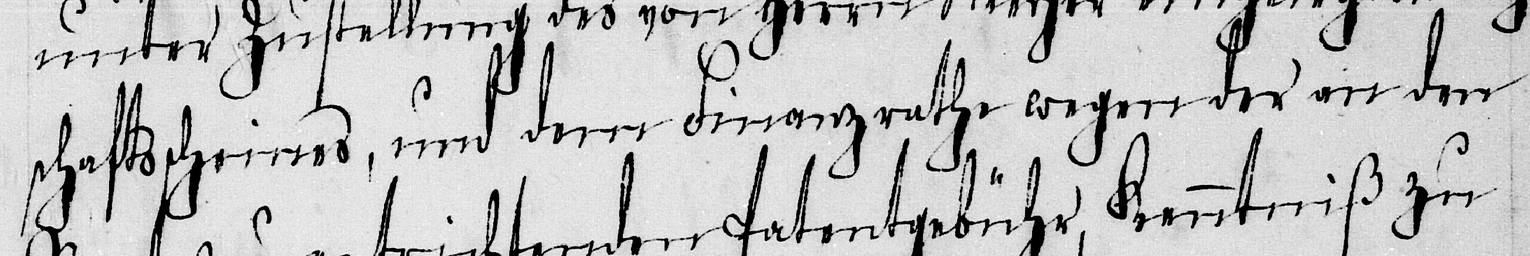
schaftsscheines, und dem Finanzrathe wegen der an den
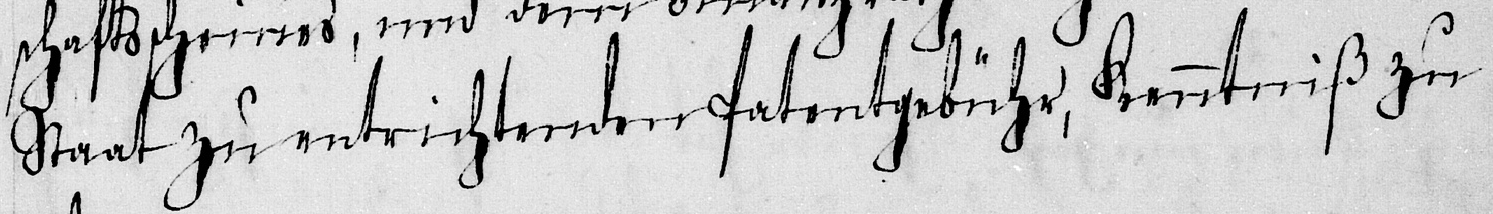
Staat zu entrichtenden Patentgebühr, Kenntniß zu
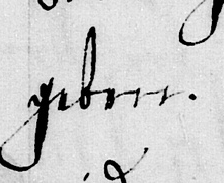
geben.
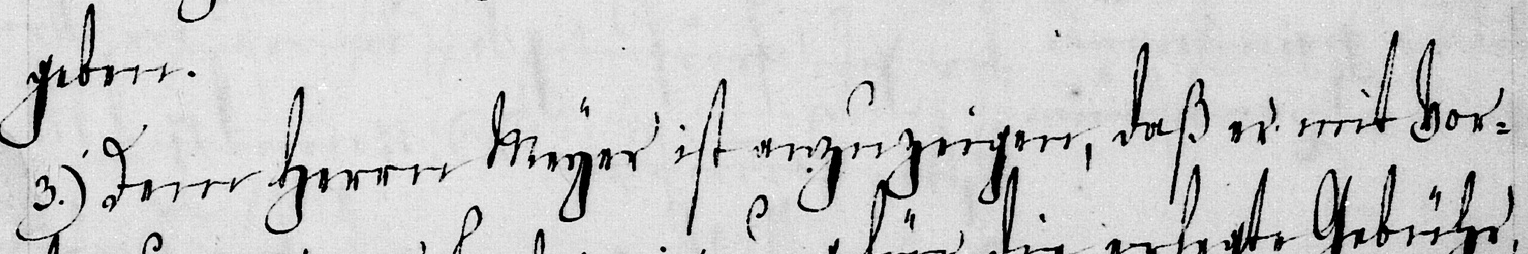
3.) Dem Herrn Meyer ist anzuzeigen, daß er mit Vor¬
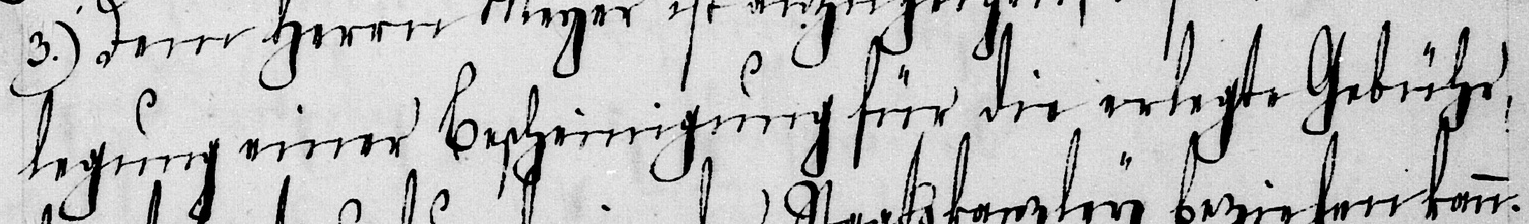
legung einer Bescheinigung für die erlegte Gebühr,
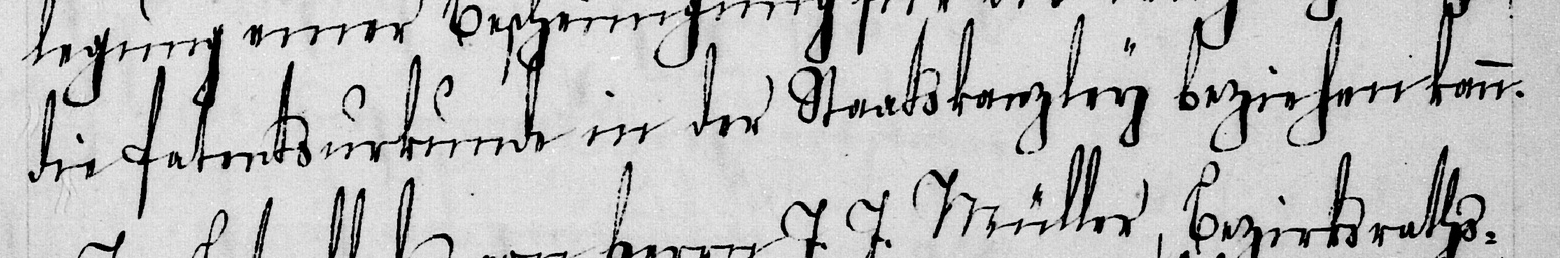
die Patentsurkunde in der Staatskanzley beziehen kann.
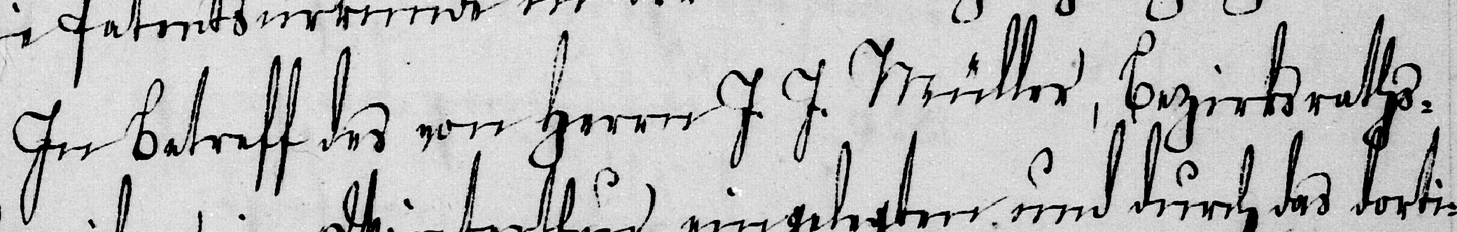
In Betreff des von Herrn J. J. Müller, Bezirksraths¬
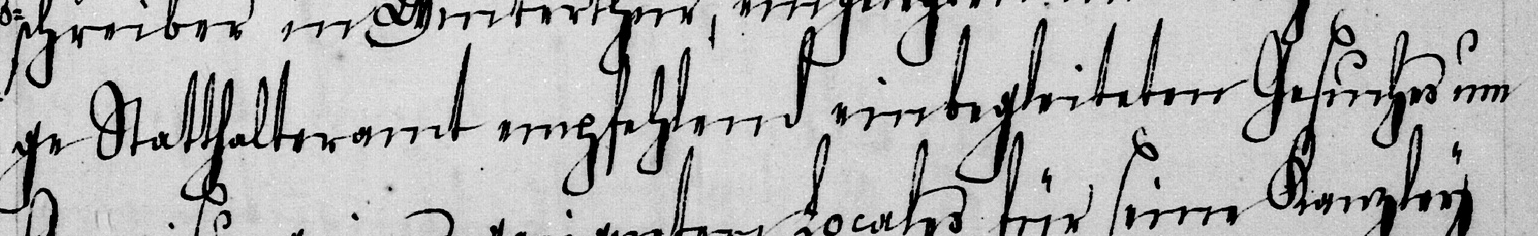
ge Statthalteramt empfehlend einbegleiteten Gesuchs um
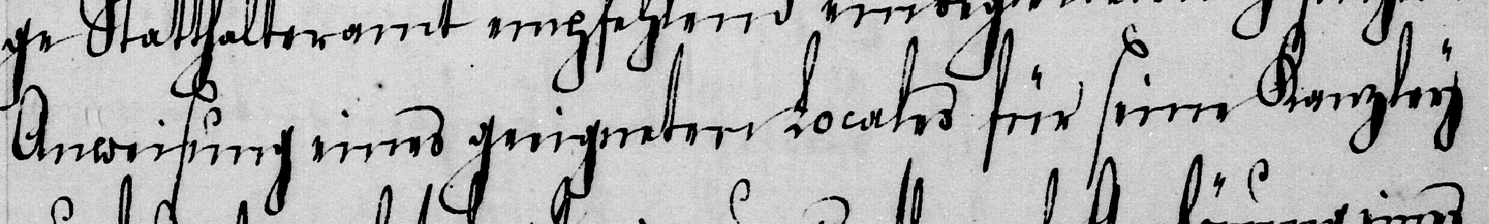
Anweisung eines geeigneten Locales für seine Kanzley
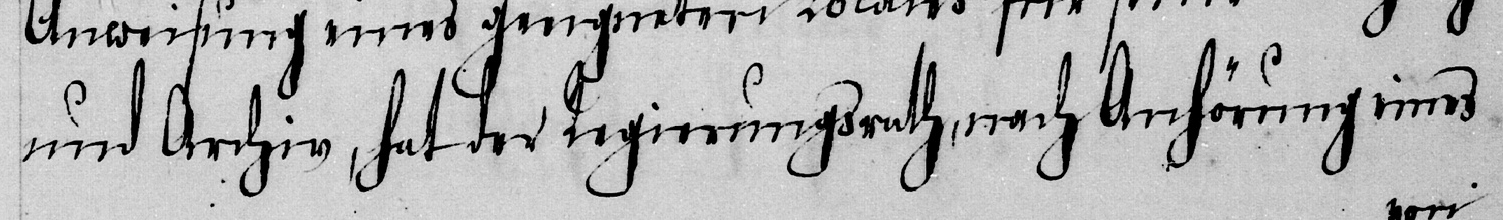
und Archiv, hat der Regierungsrath, nach Anhörung eines
